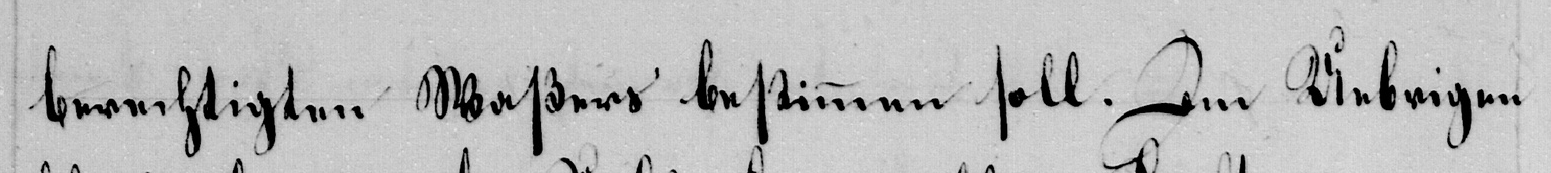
berechtigten Waßers bestimmen soll. Im Uebrigen
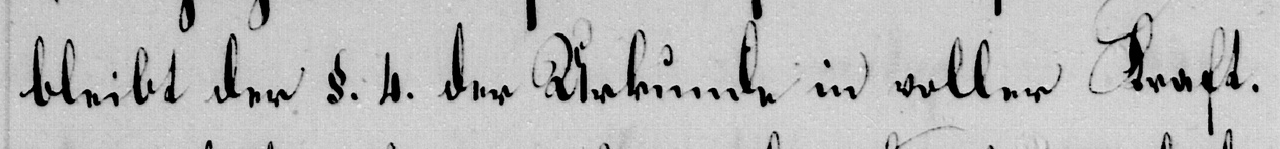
bleibt der §. 4. der Urkunde in voller Kraft.
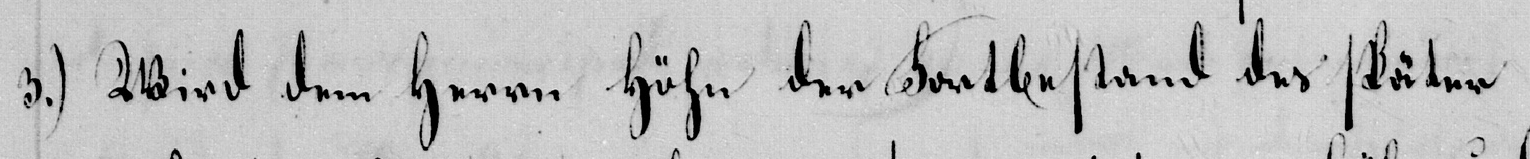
3.) Wird dem Herrn Höhn der Fortbestand des später
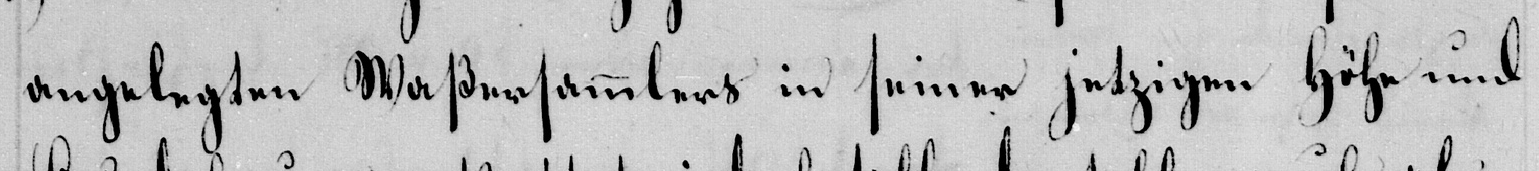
angelegten Waßersammlers in seiner jetzigen Höhe und
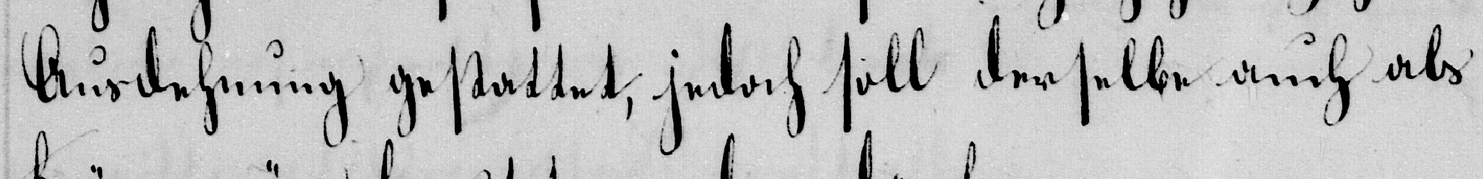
Ausdehnung gestattet, jedoch soll derselbe auch als
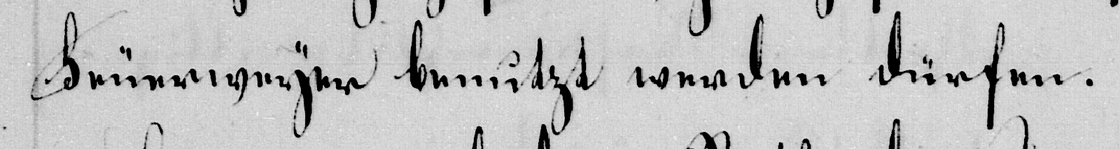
Feuerweyer benutzt werden dürfen.
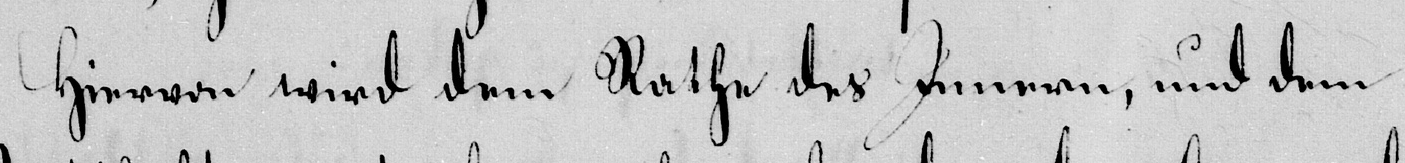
Hiervon wird dem Rathe des Innern, und dem
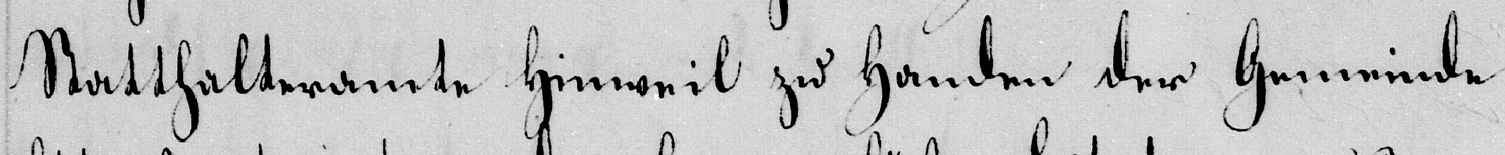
Statthalteramt Hinweil zu Handen der Gemeinde
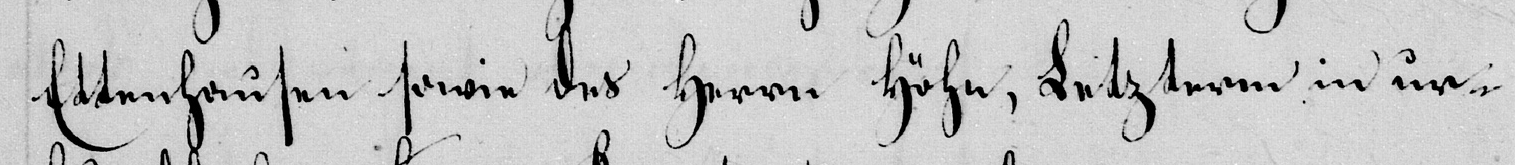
Ettenhausen sowie des Herrn Höhn, Letzterm in ur¬
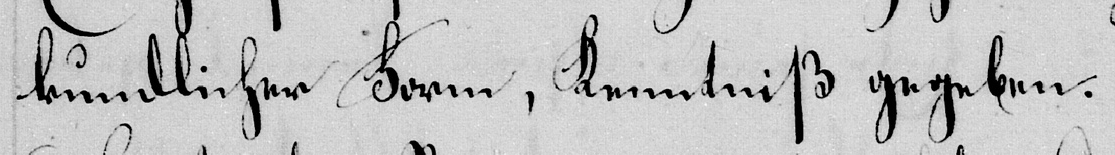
kundlicher Form, Kenntniß gegeben.
